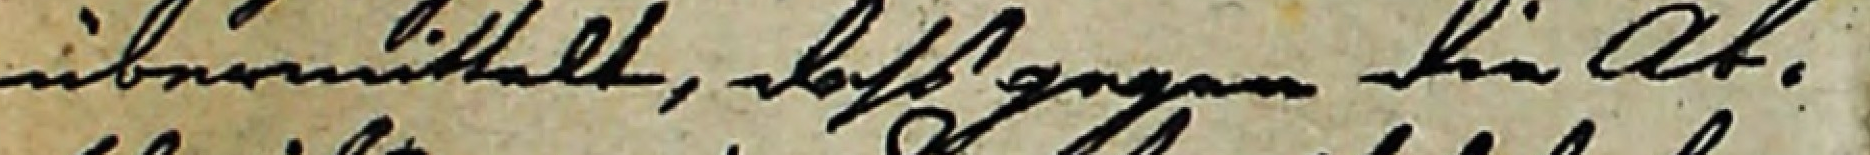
übermittelt, dass gegen die Ab„
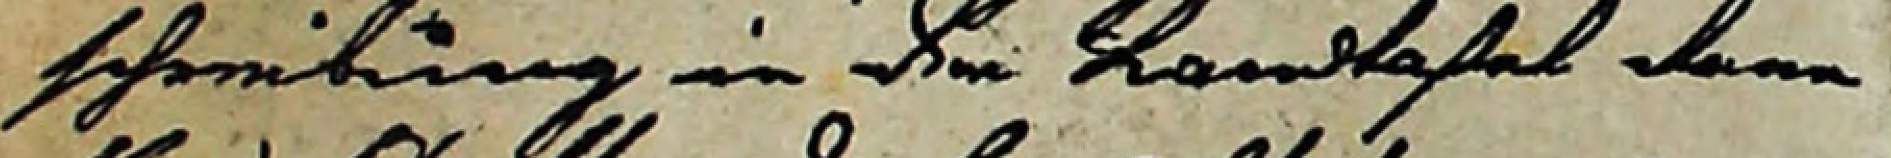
schreibung in der Landtafel dann
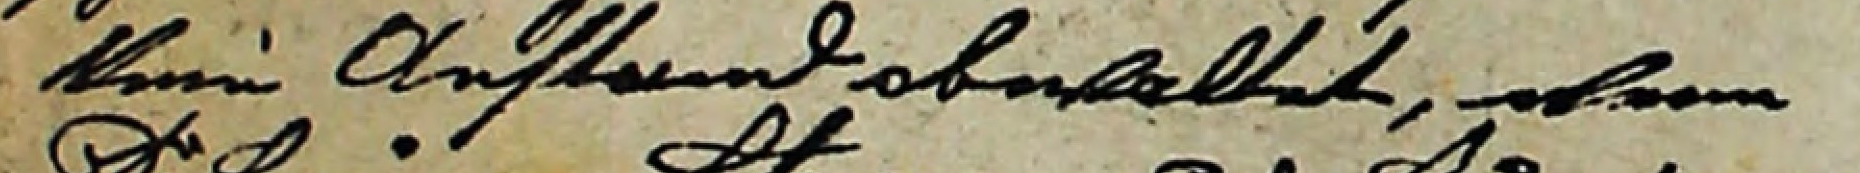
kein Anstand obwaltet, denen
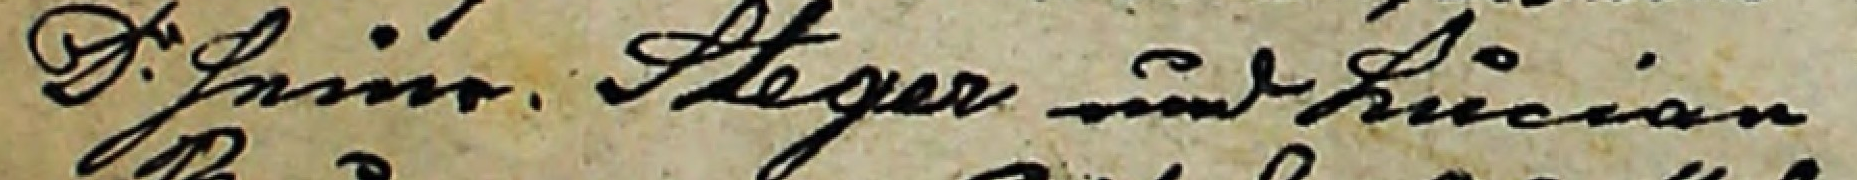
Dr. Heinr. Steger und Lucian
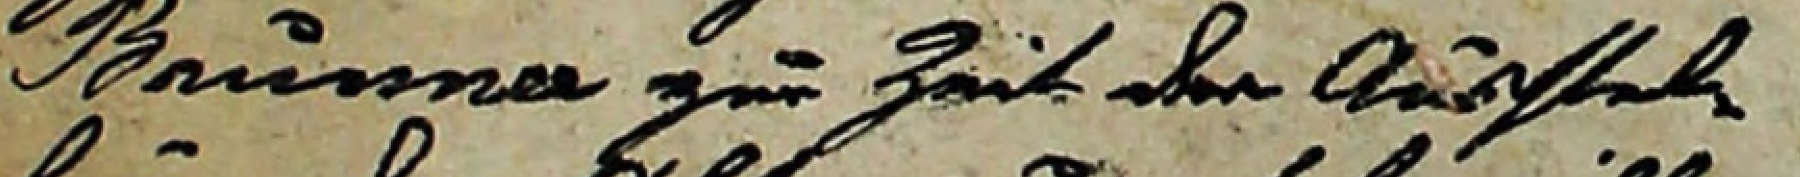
Brunner zur Zeit der Ausstel„
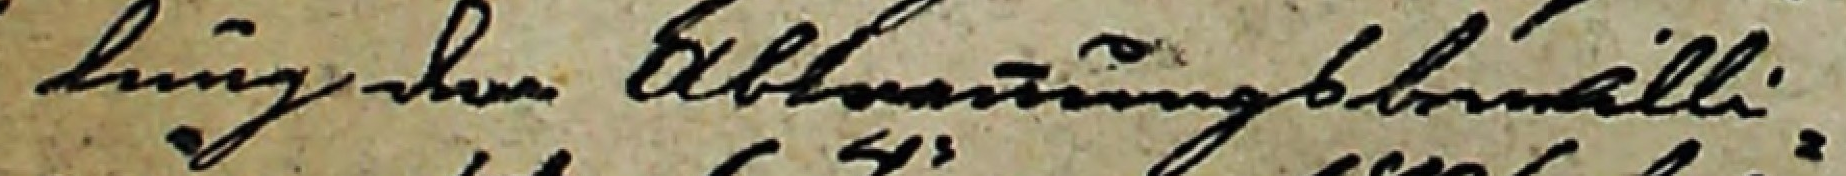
lung dem Abtrennungsbewilli=
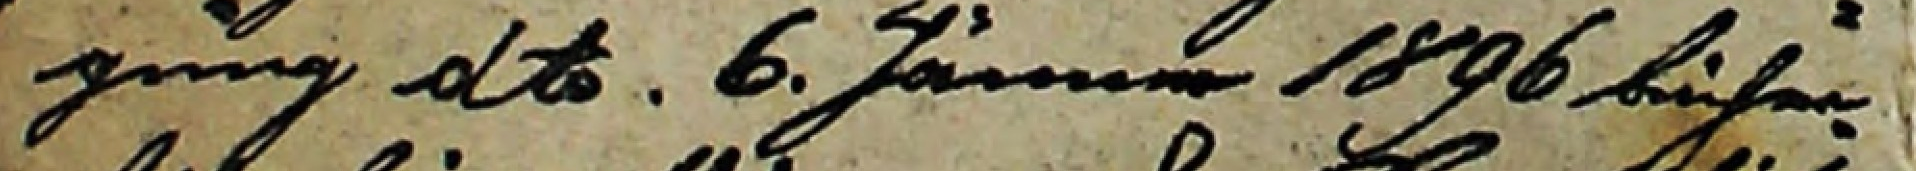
gung dto. 6. Jänner 1896 buchen=
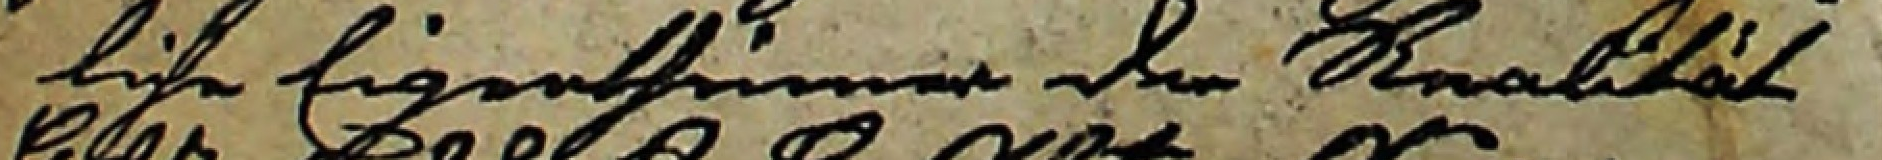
liche Eigenthumer den Realität
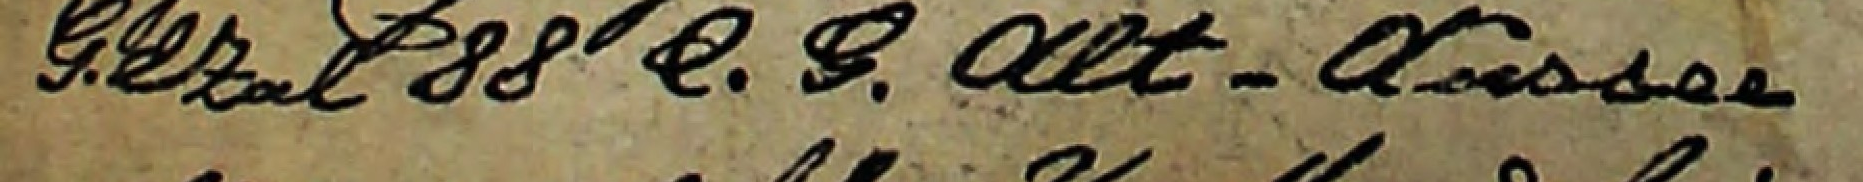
G.d Zal 88 C.G. Alt - Aussee
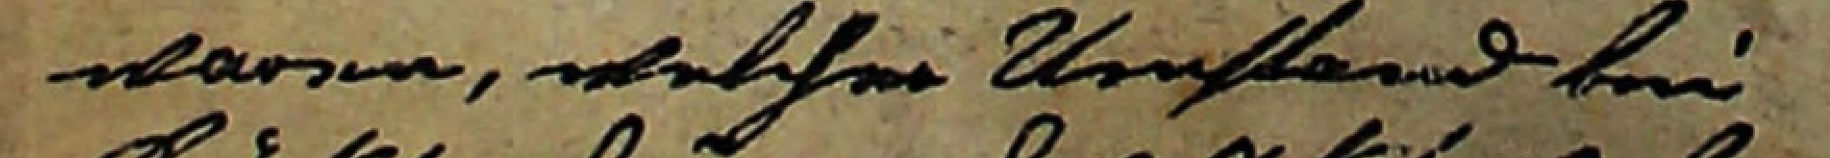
waren, welchen Umstand bei
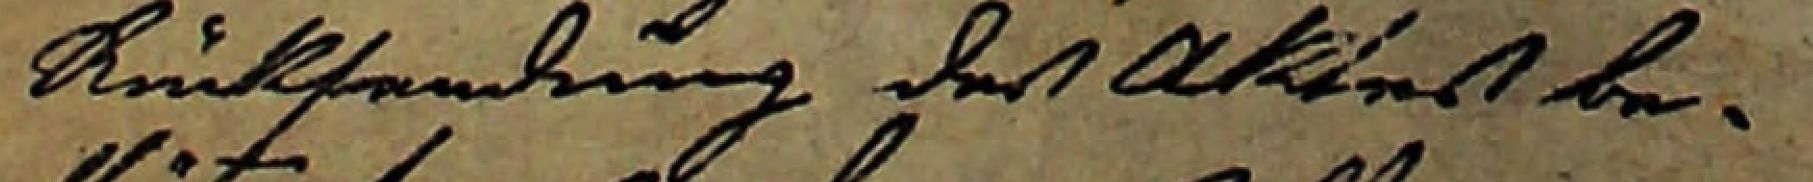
Rückfandung des Aktes be=
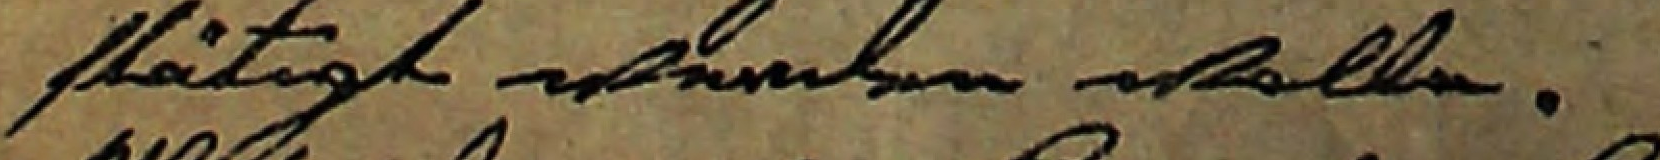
stätigt werden wallen.
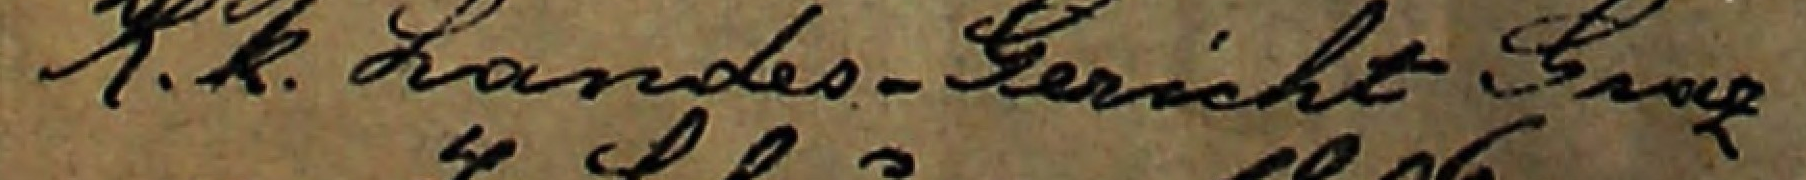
k.k. Landes - Gericht Graz
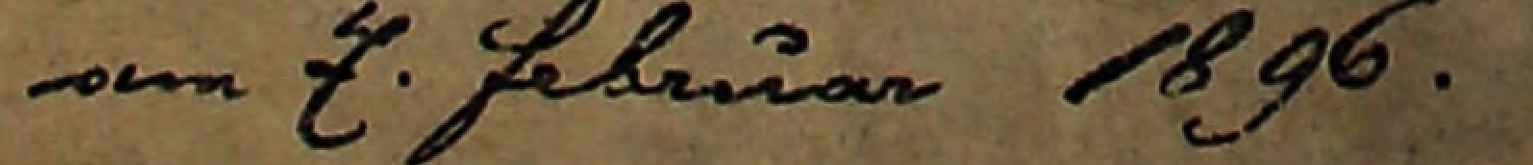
am 7. Februar 1896.
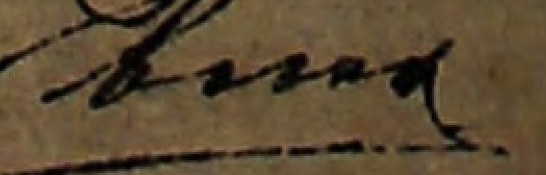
Ebned
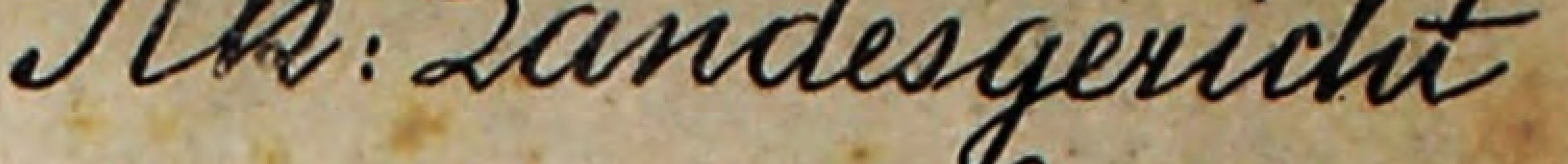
Kk: Landesgericht
